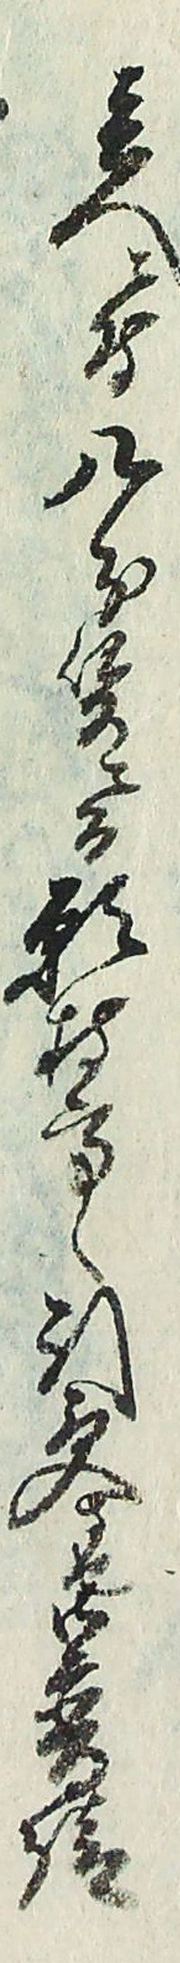一人に付八分賃にて願村方へ引受させ御普請
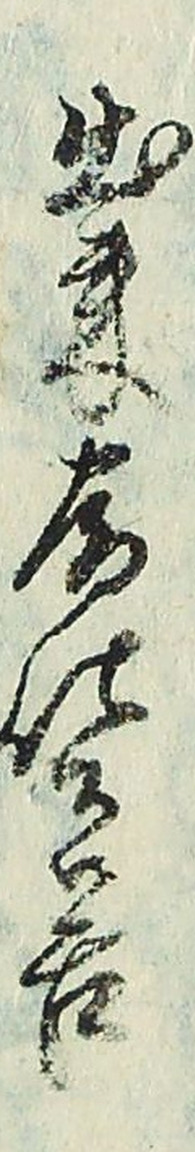出来為仕候筈
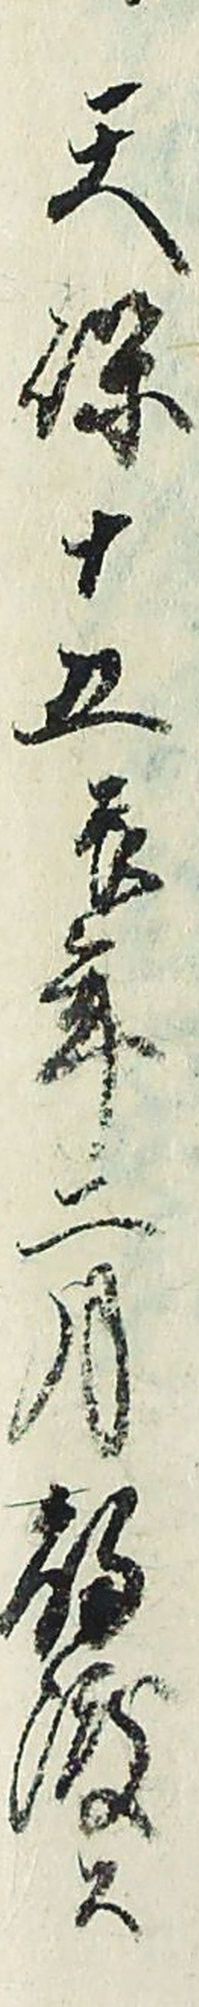天保十五辰年二月触渡す
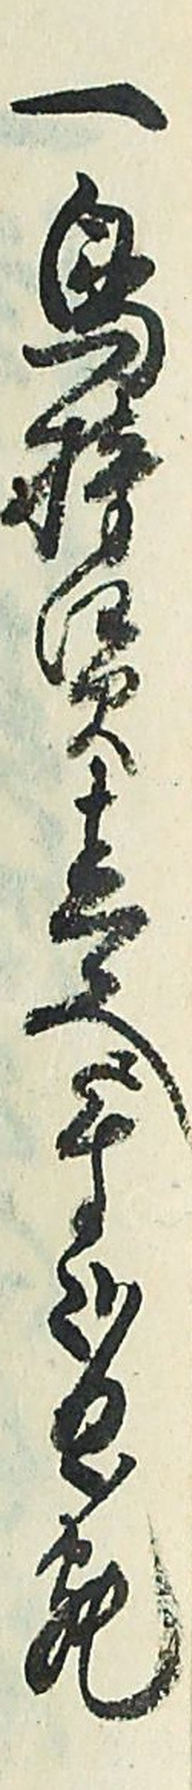一鳥持賃一人に付二匁宛
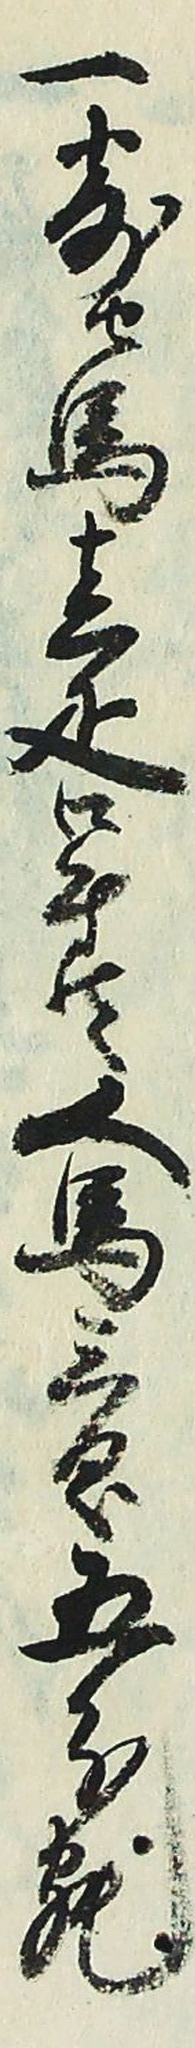一寄せ馬一疋口付共人馬三匁五分宛
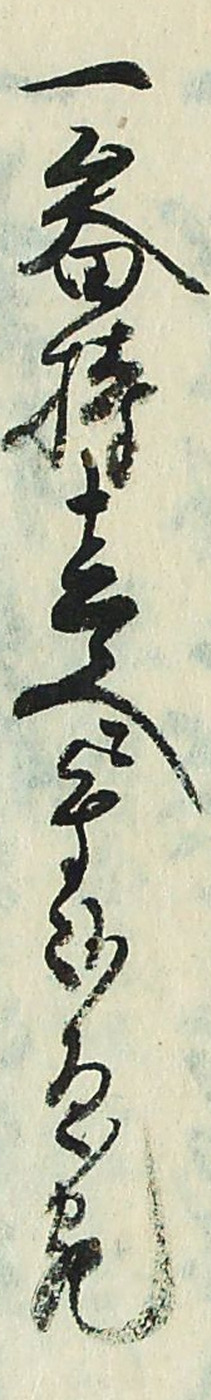一畚持一人に付二匁宛
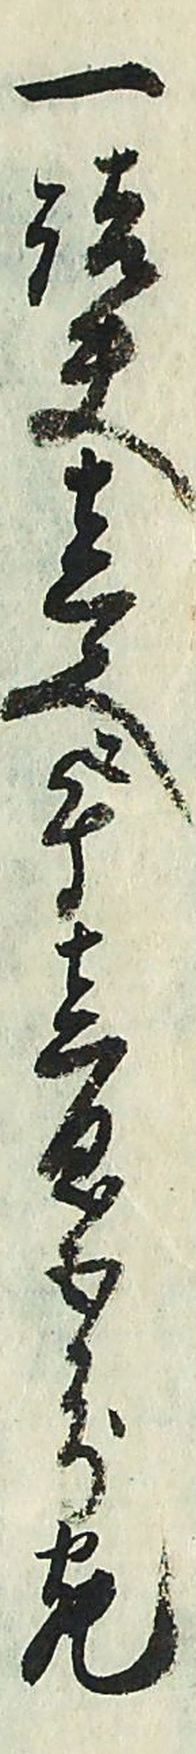一詰夫一人に付一匁五分宛
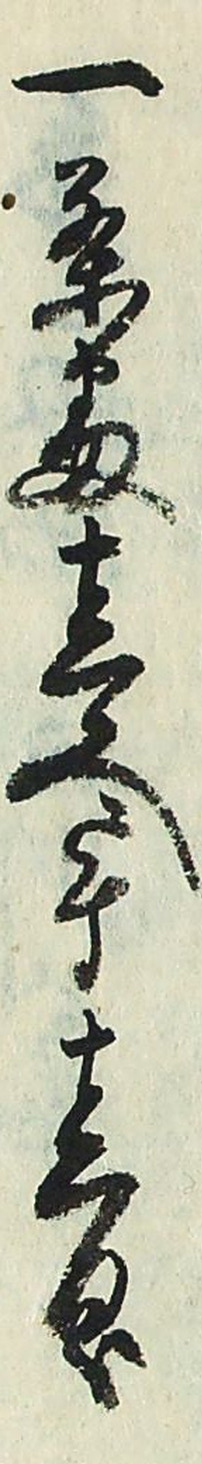一茶番一人に付一匁
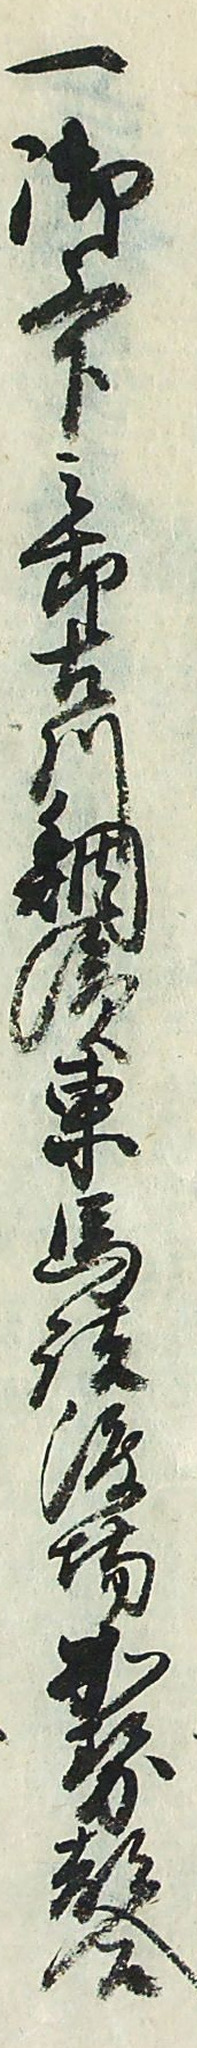一御上下の節古川鯛濱東馬詰渡場加勢都合
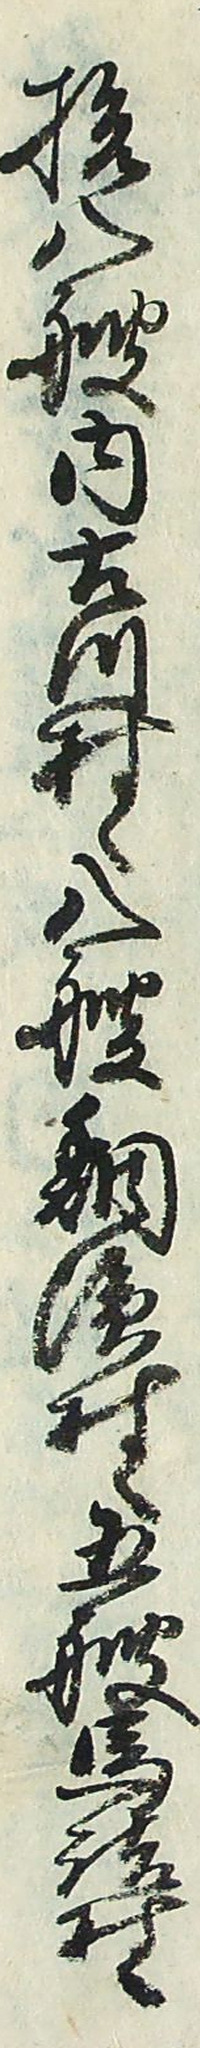十八艘内古川村へ八艘鯛濱村へ五艘馬詰村へ

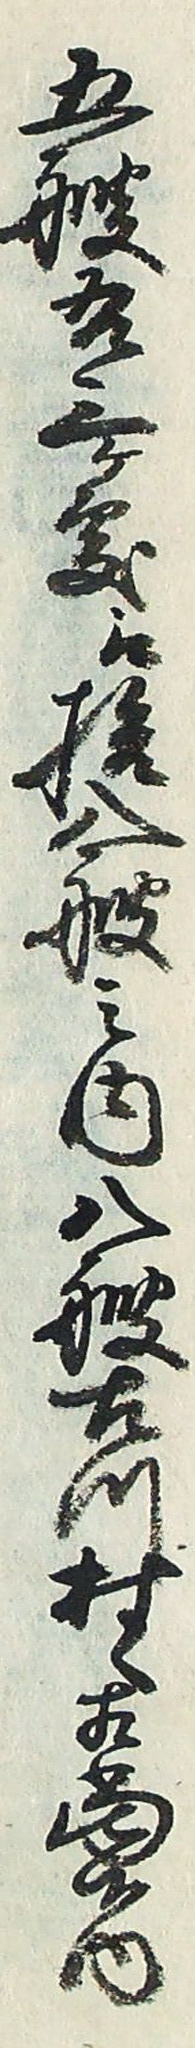五艘右三ヶ処え十八艘の内八艘古川村へ相当候内
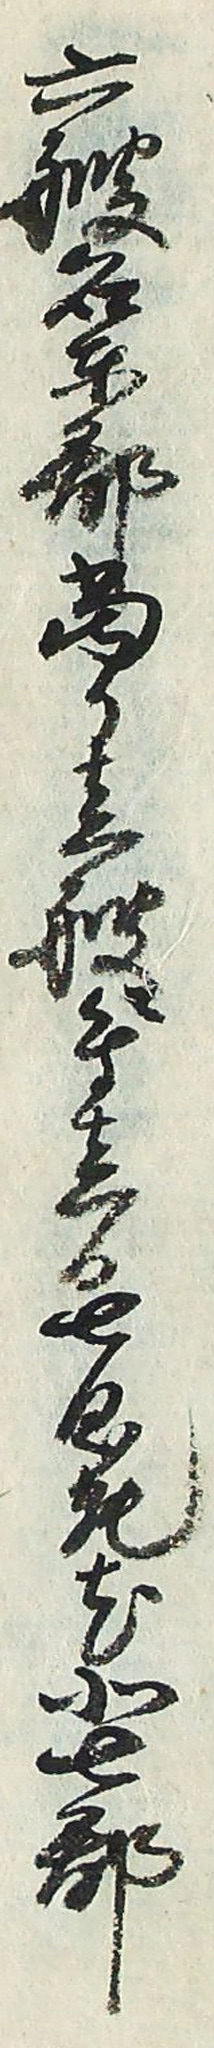六艘名東郡当り一艘に付一日七匁宛尤北七郡
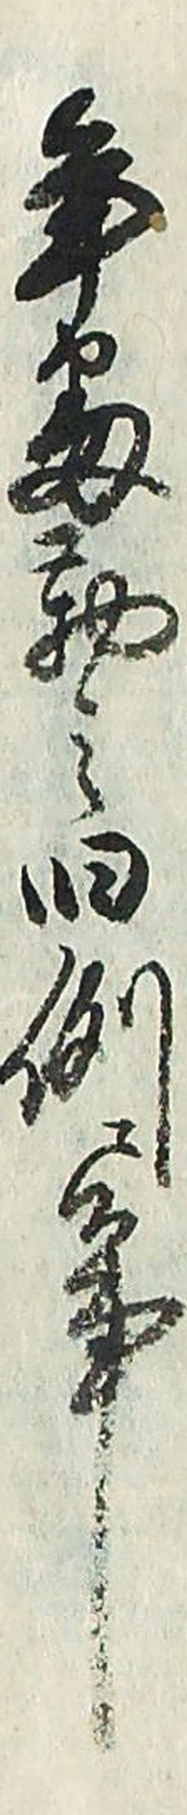年番勤の旧例に候事
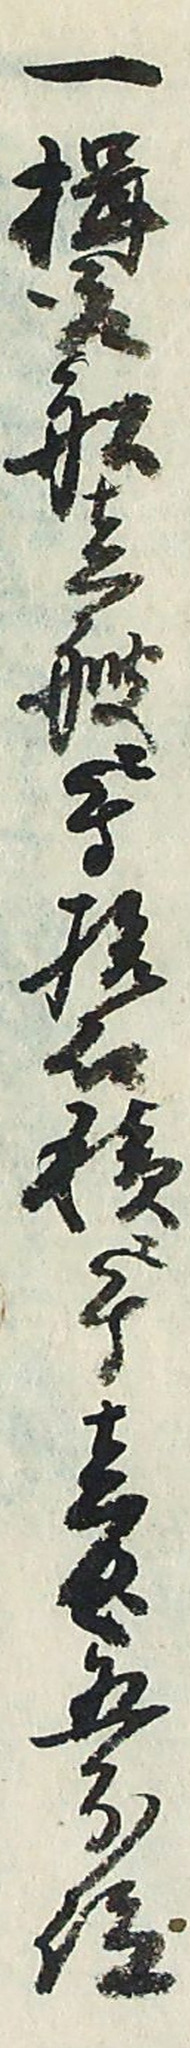一楫取船一艘に付十石積に付一匁五分位
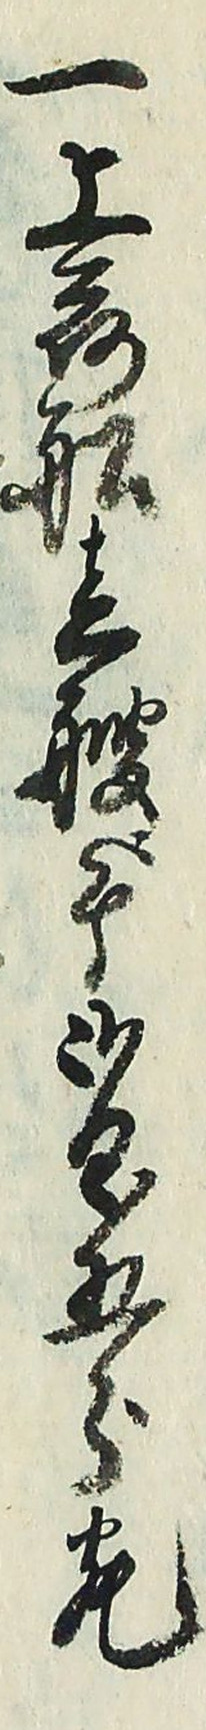一上荷船一艘に付二匁五分宛
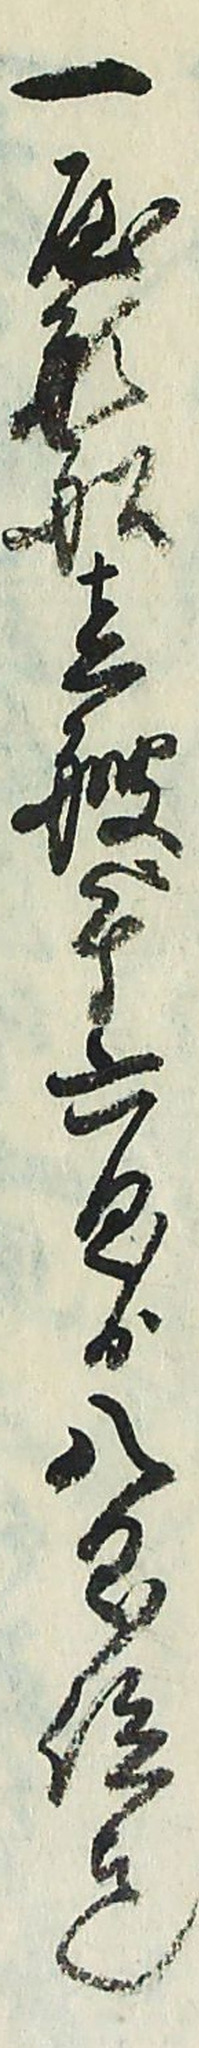一屋形船一艘に付六匁より八匁位迄
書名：諸割賦物賃銀定記録帳
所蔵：鳴門教育大学 Naruto University of Education
